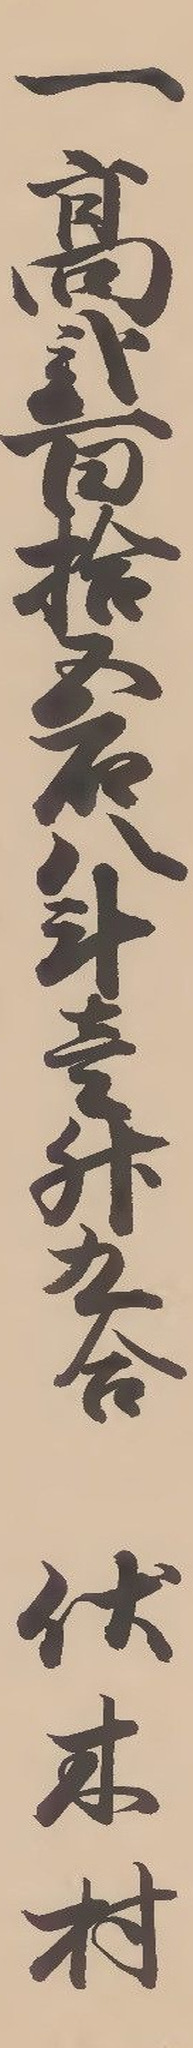一高弐百拾五石八斗壱升九合伏木村
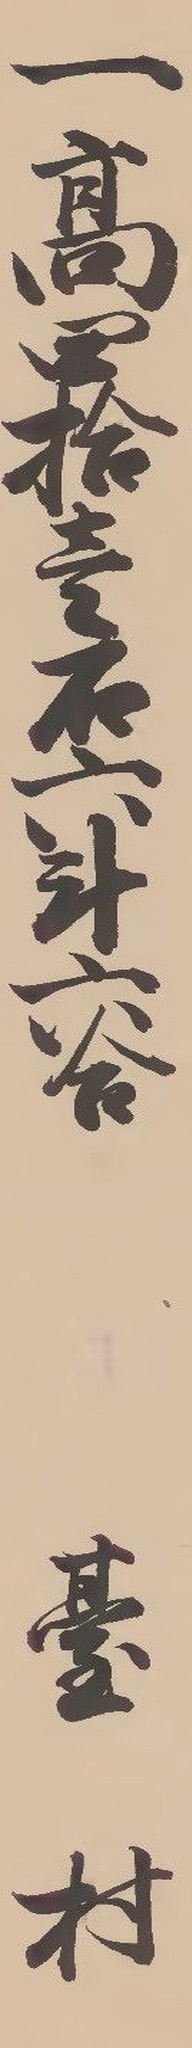一高四拾壱石六斗六合台村
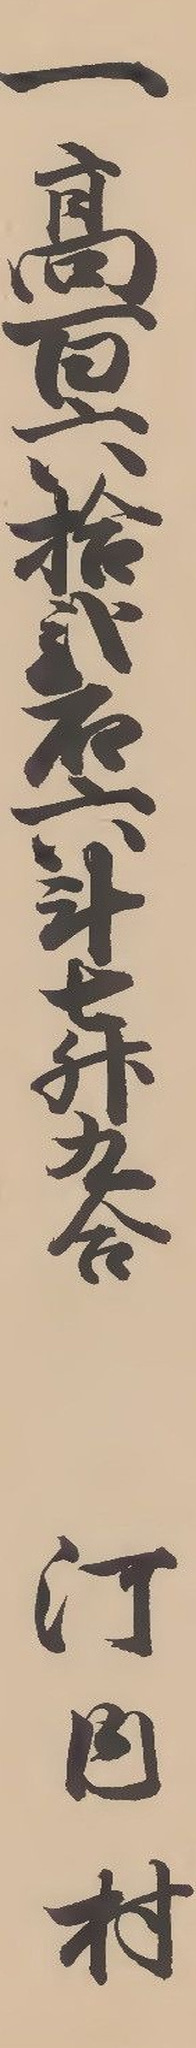一高百六拾弐石六斗七升九合河内村
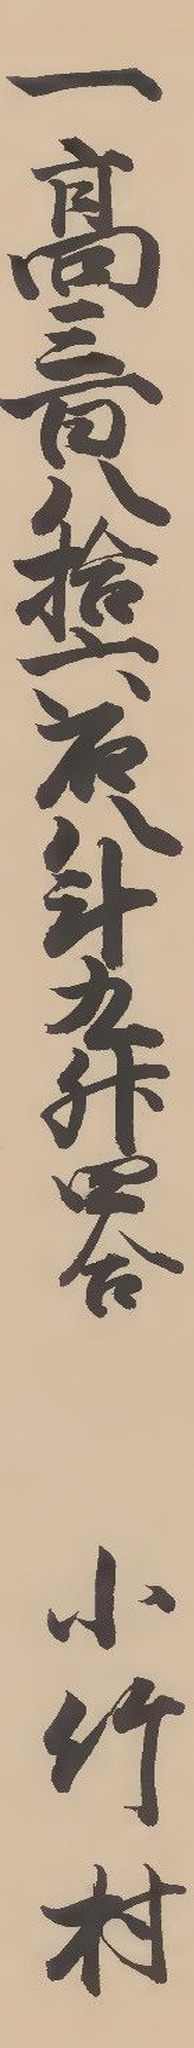一高三百八拾六石八斗九升四合小竹村
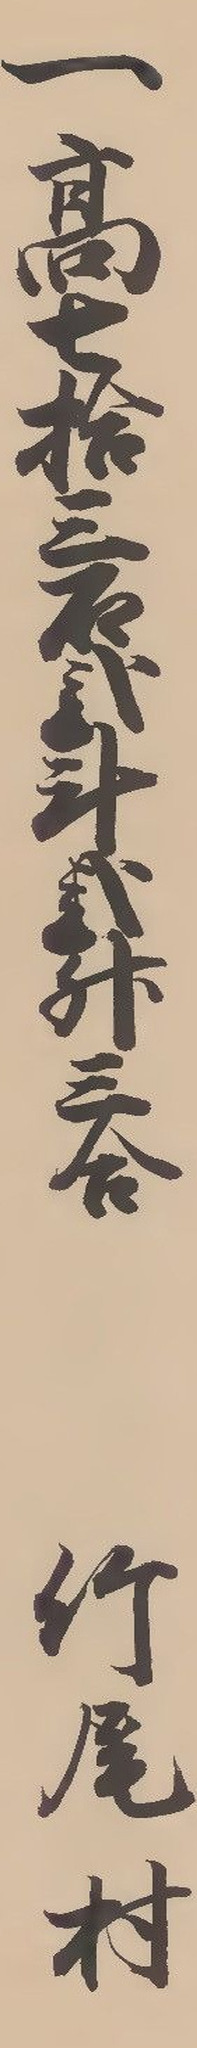一高七拾三石弐斗弐升三合竹尾村
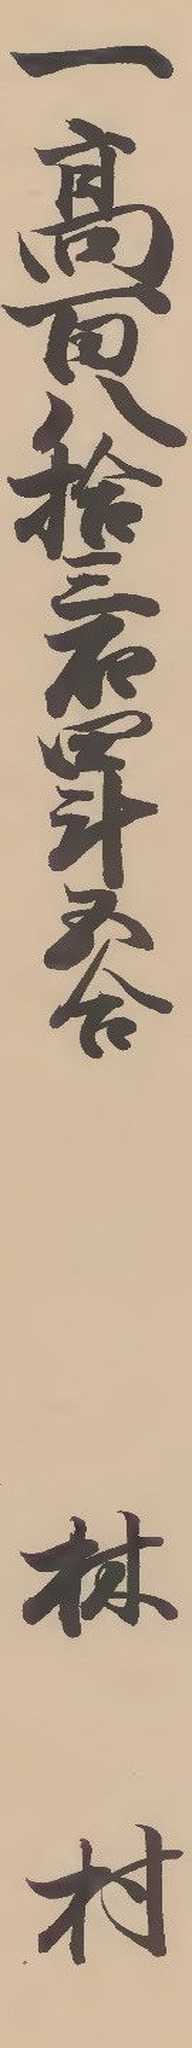一高百八拾三石四斗五合林村

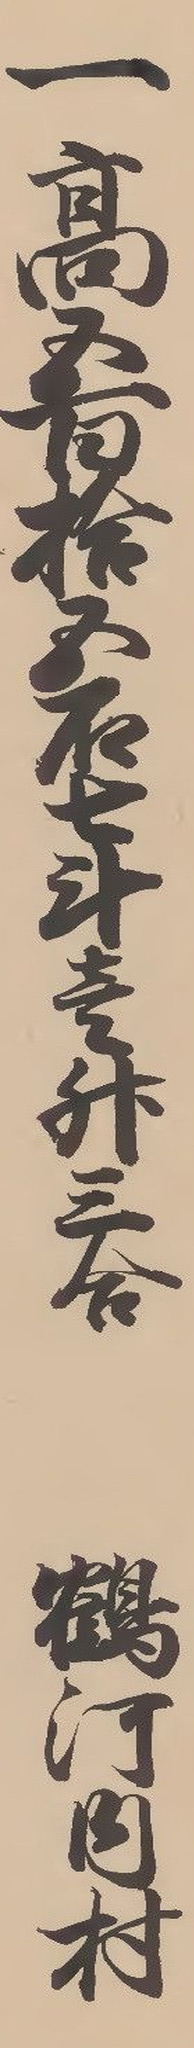一高五百拾五石七斗壱升三合鶴河内村
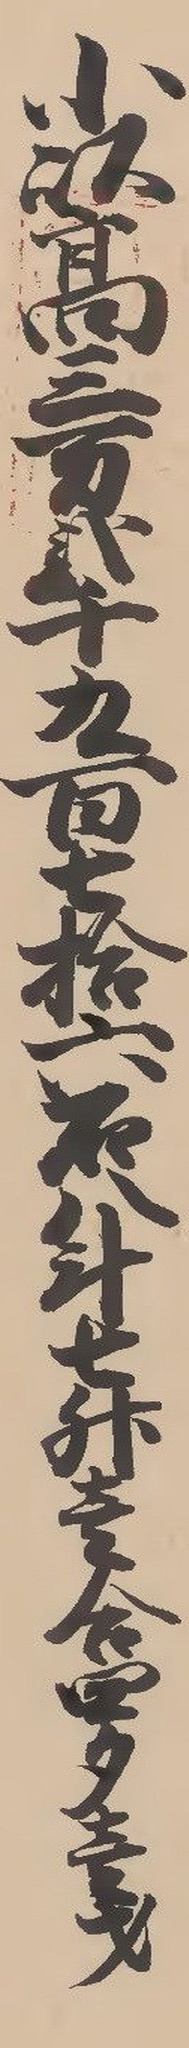小以高三万弐千九百七拾六石八斗七升壱合四勺壱才
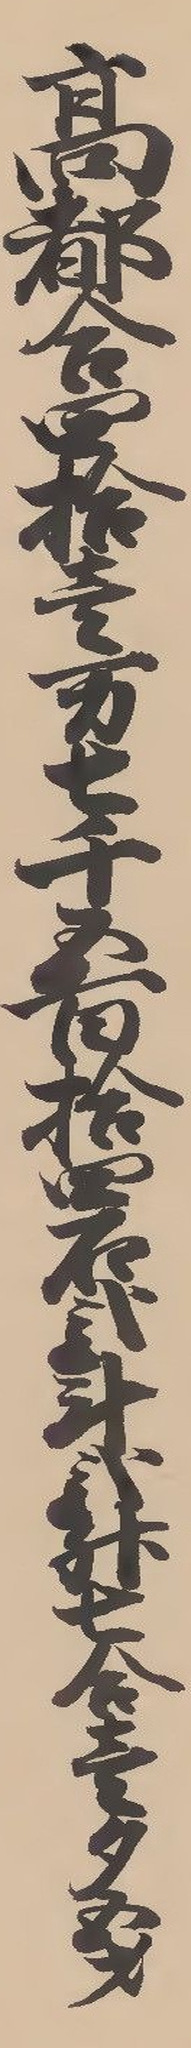高都合四拾壱万七千五百拾四石弐斗弐升七合壱勺五才
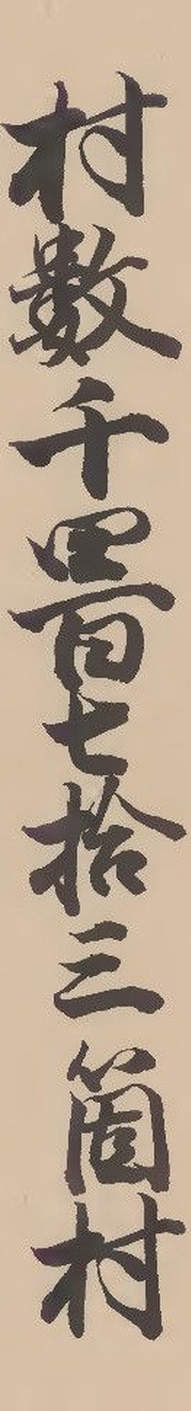村数千四百七拾三箇村
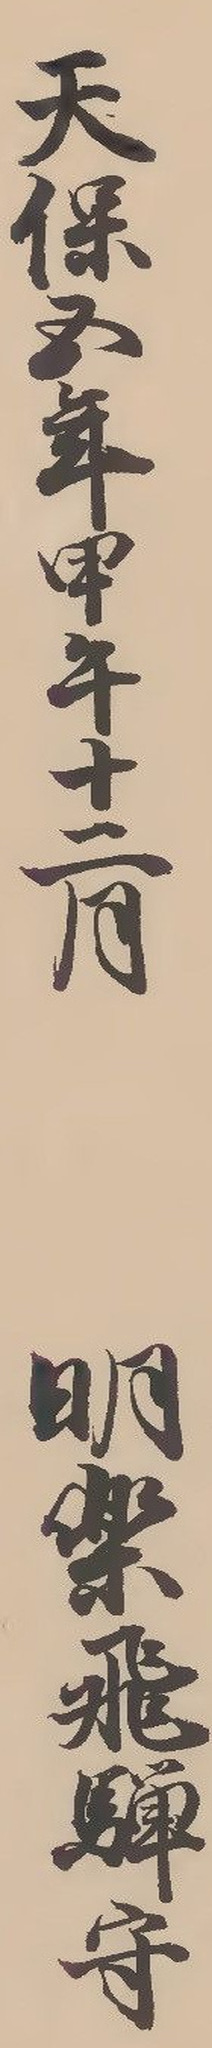天保五年甲午十二月明楽飛騨守
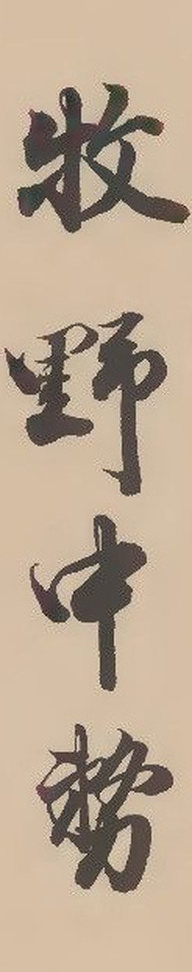牧野中務
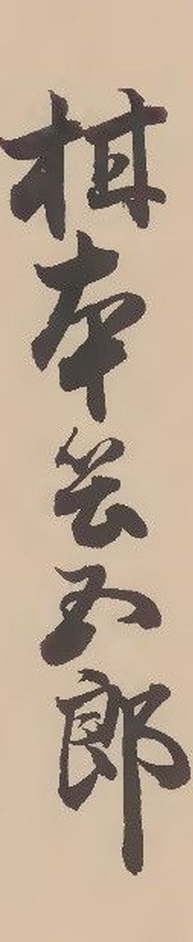柑本兵五郎
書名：豊後国郷帳
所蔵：国立公文書館 National Archives of Japan
